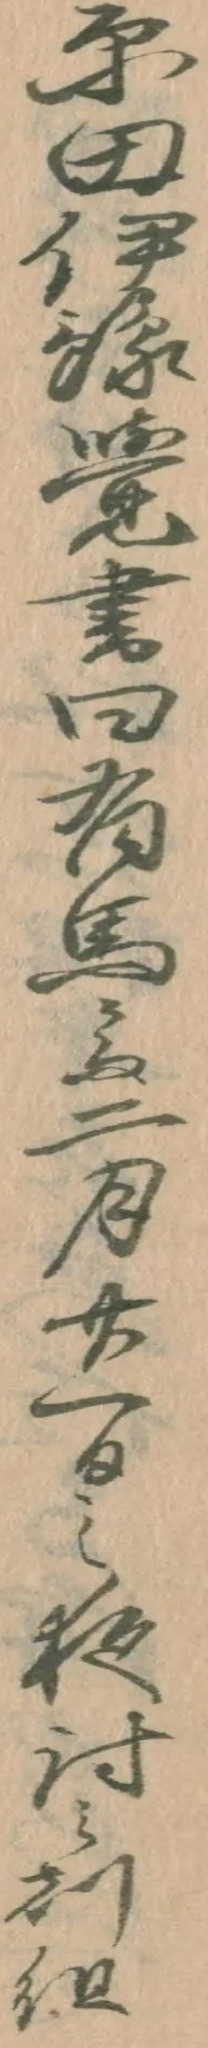原田伊豫覚書曰有馬に而二月廿一日之夜討之刻組
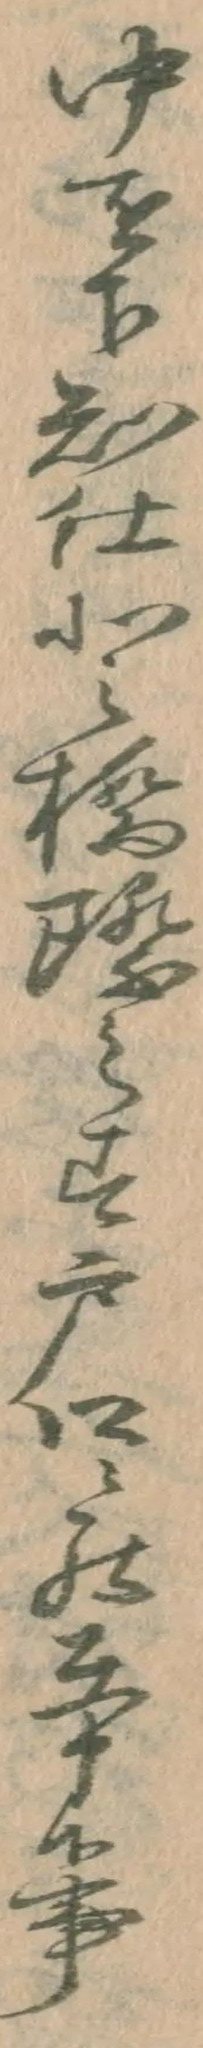中を下知仕北之橋際之春戸口に罷在申候事
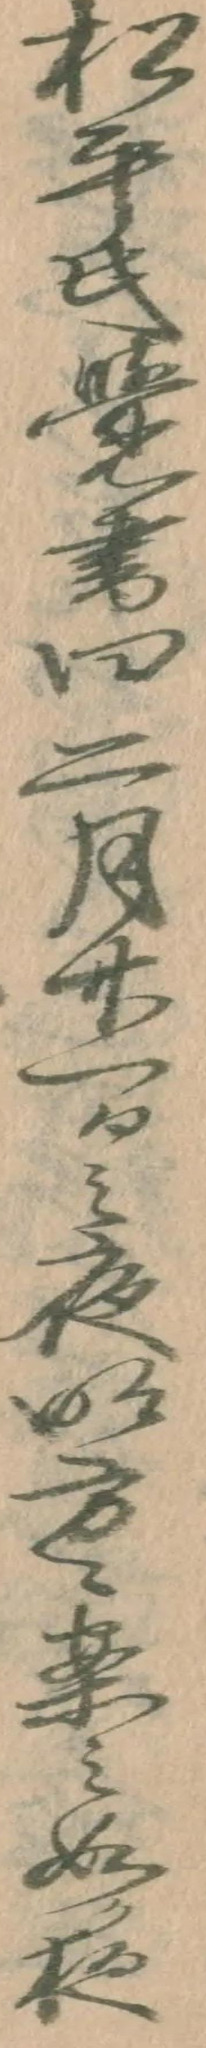松平氏覚書曰二月廿一日之夜明方に案み如く夜
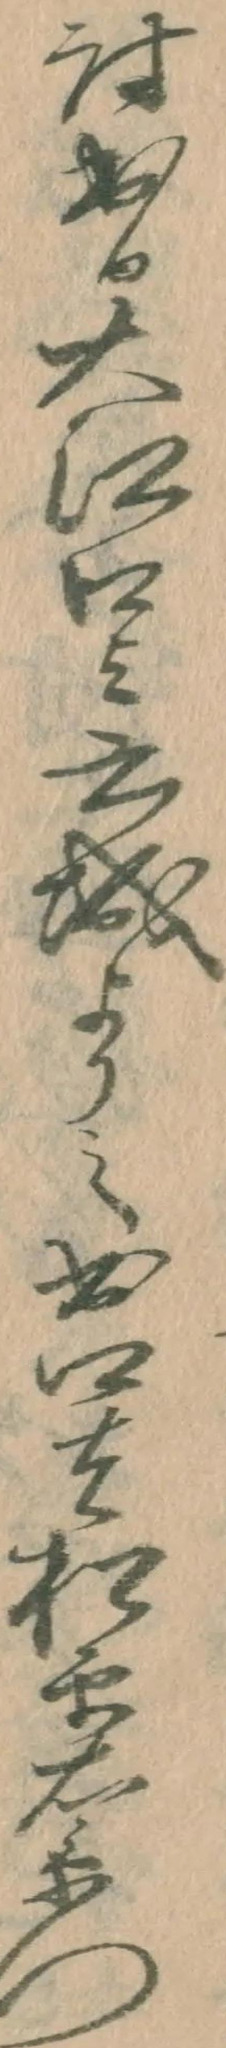討出る大江口与云城より之出口者松平右衛門
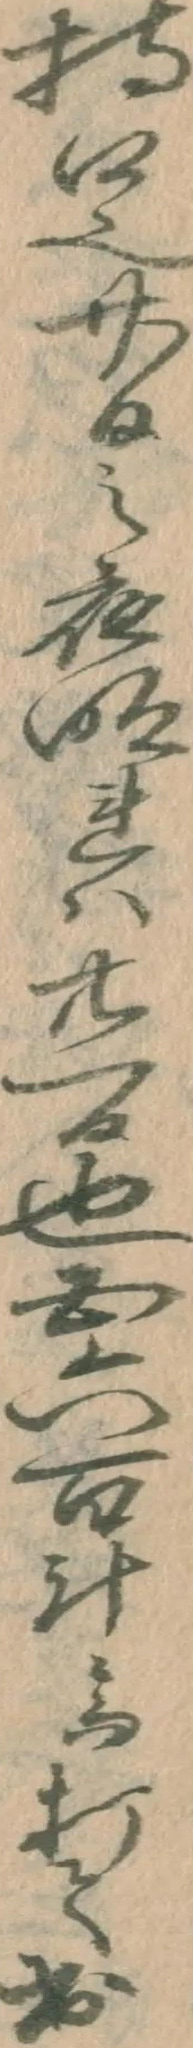持口也廿日之夜明連は廿一日也五六百斗に而打て出
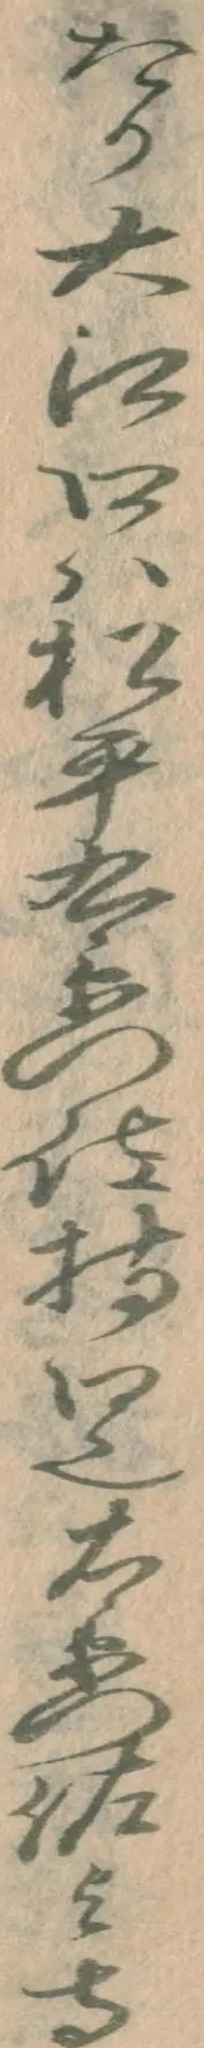たり大江口は松平右衛門佐持口也右衛門佐与寺
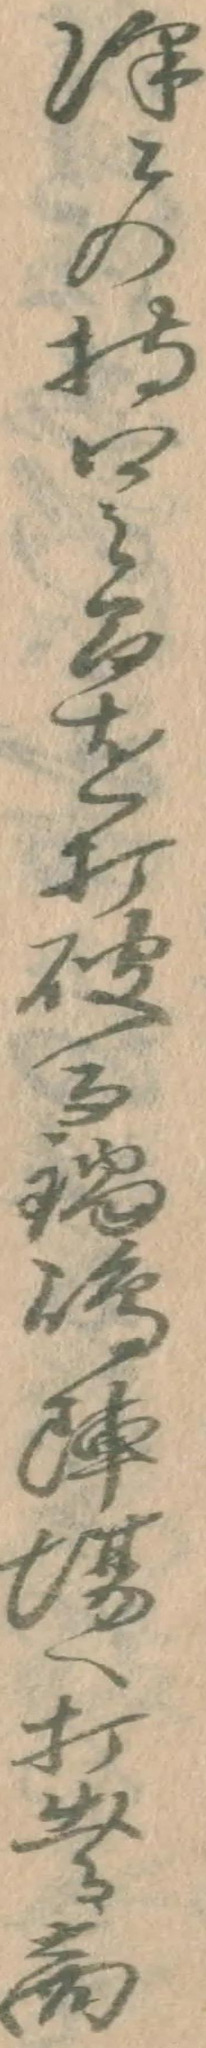沢との持口之間を打破而鍋島陣場へ打出る商
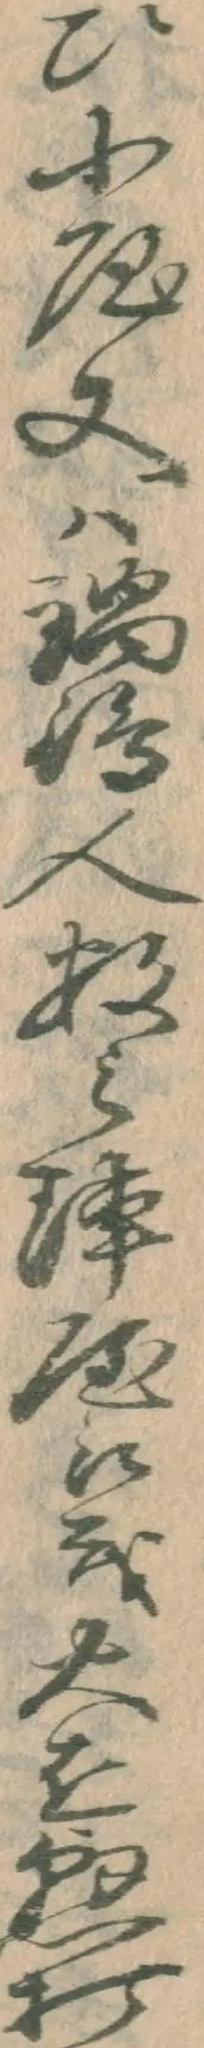ひ小屋又は鍋島人数之陣屋江茂火を懸打
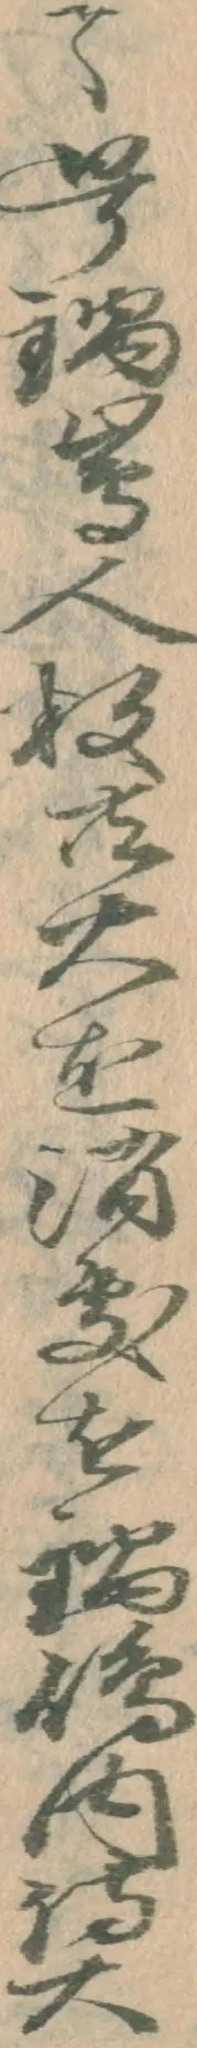て廻り鍋島人数共火を消處を鍋島内侍大
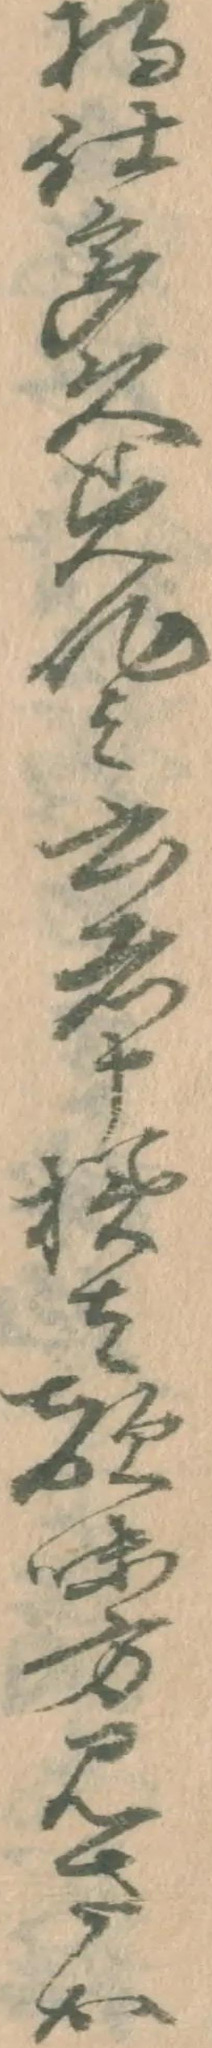将仕多久美作与云者申様者敵味方見さか

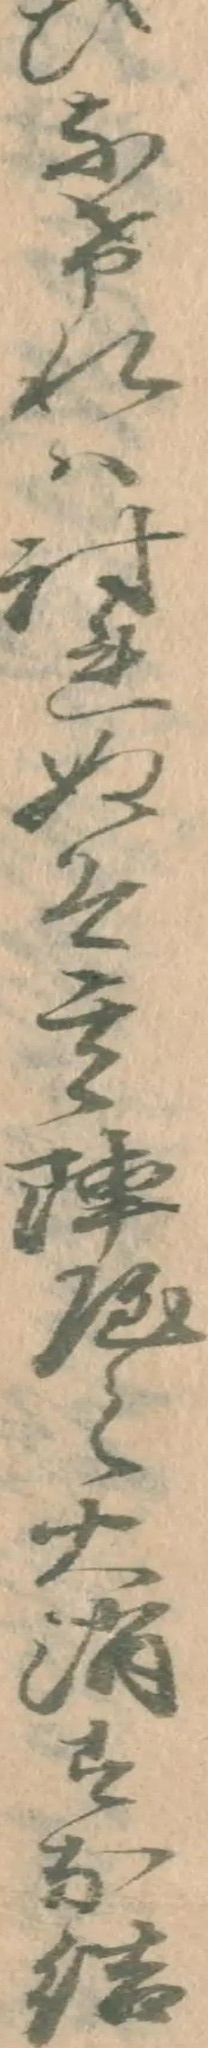ひな希れは討連ぬそ其陣屋之火消春な結
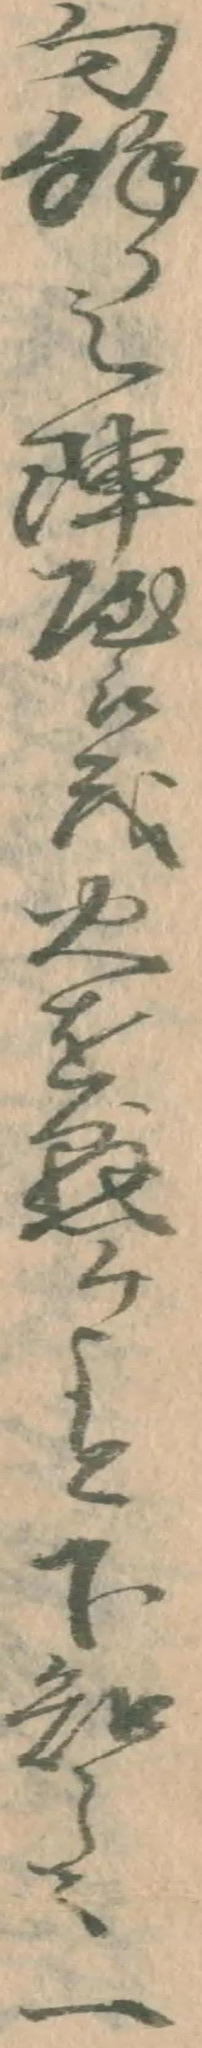句余り之陣屋江茂火を懸けよと下知して一
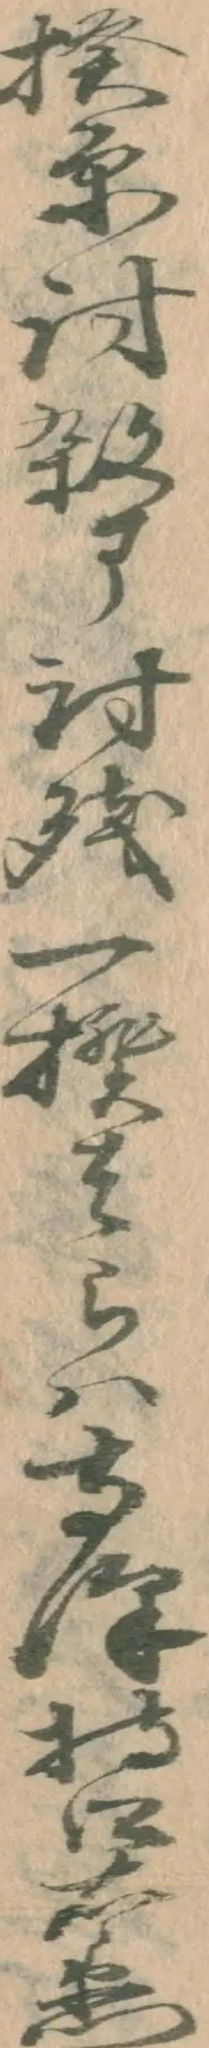揆原討殺す討残一揆者らは寺沢持口右衛門
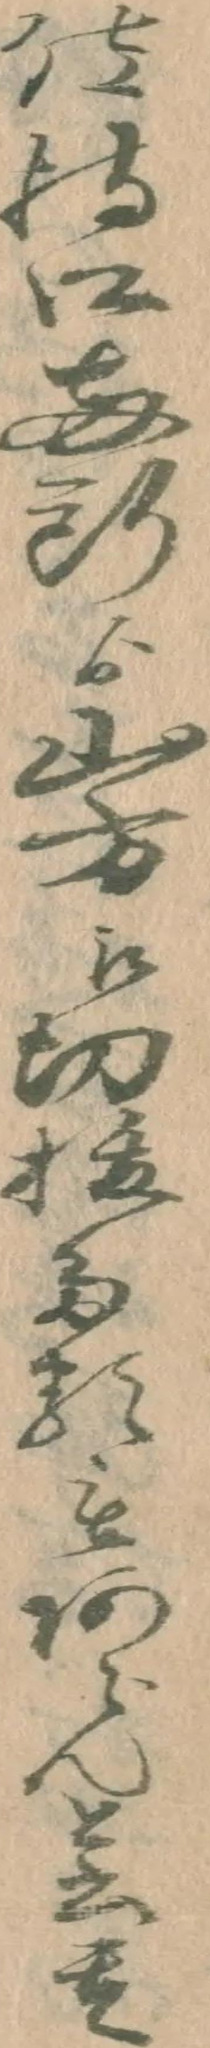佐持口両所ゟ山方江切抜多類も阿らんと云其
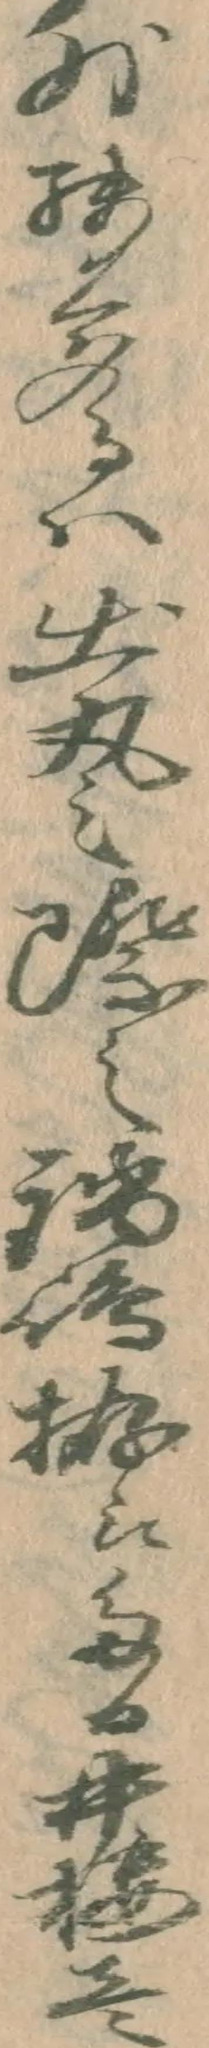外残多るは出丸之際之鍋島拵江多る井樓壱
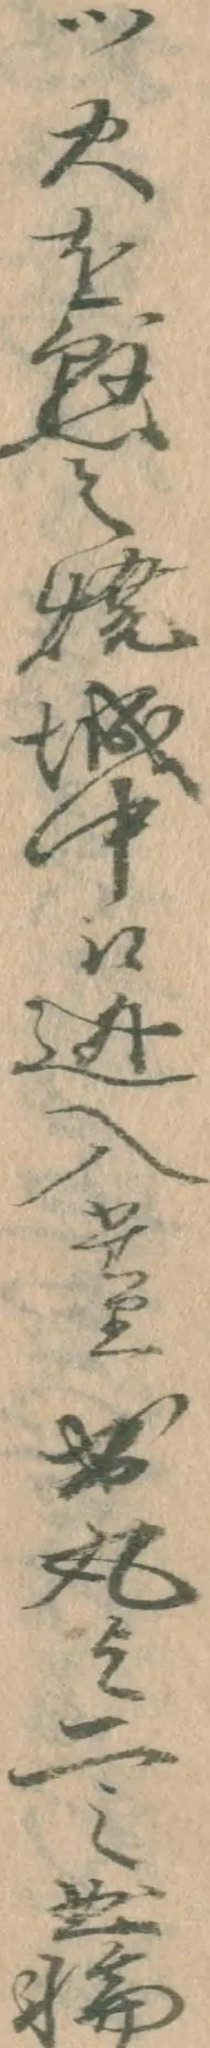つ火を懸て焼城中江逃入貴里出丸与二之曲輪
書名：切支丹御退治記 49巻. [7]
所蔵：国立国会図書館 National Diet Library, JAPAN
